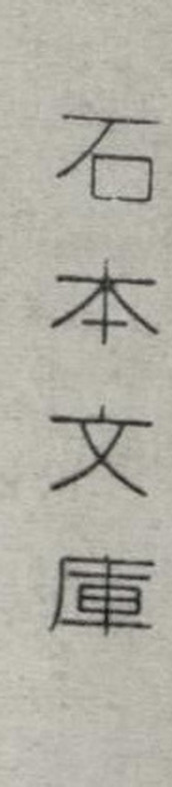石本文庫
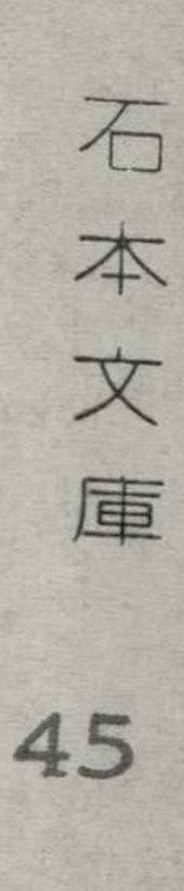石本文庫

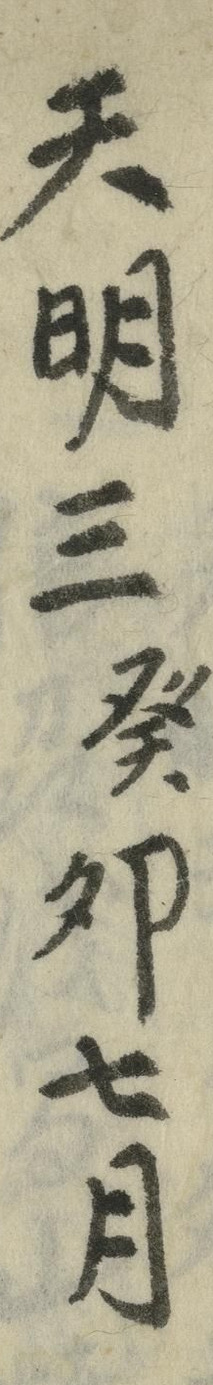天明三癸卯七月
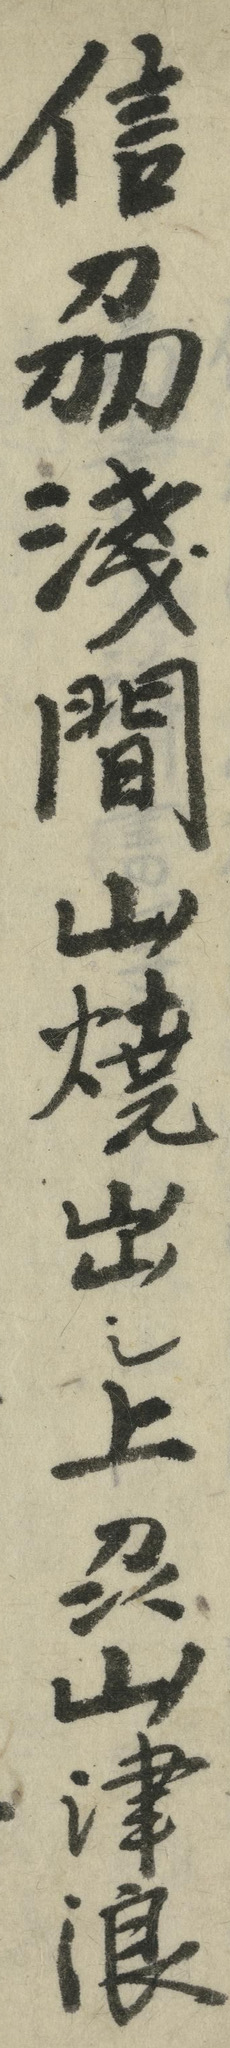信州浅間山焼出シ上州山津浪
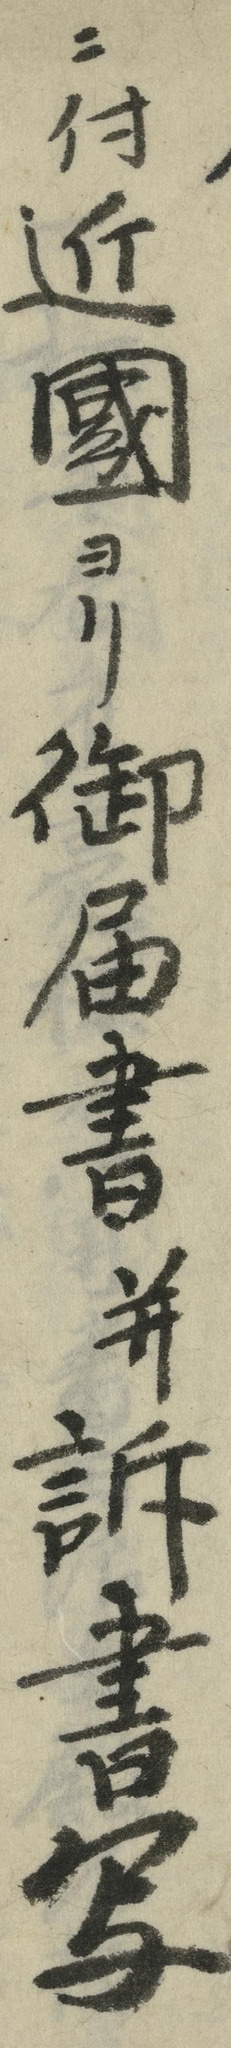ニ付近国ヨリ御届書并訴書写
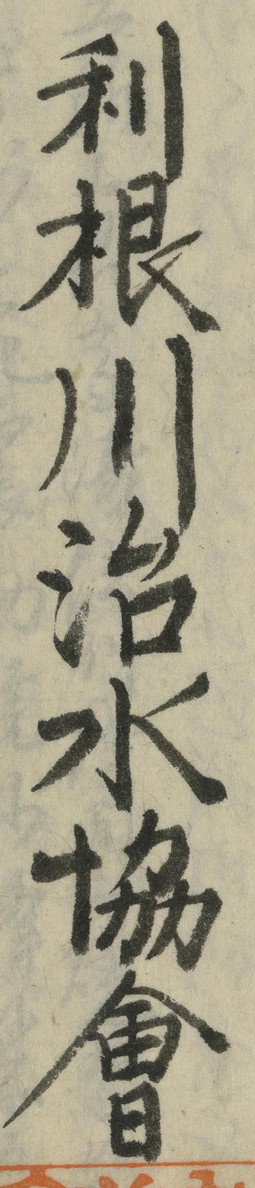利根川治水協会㊞

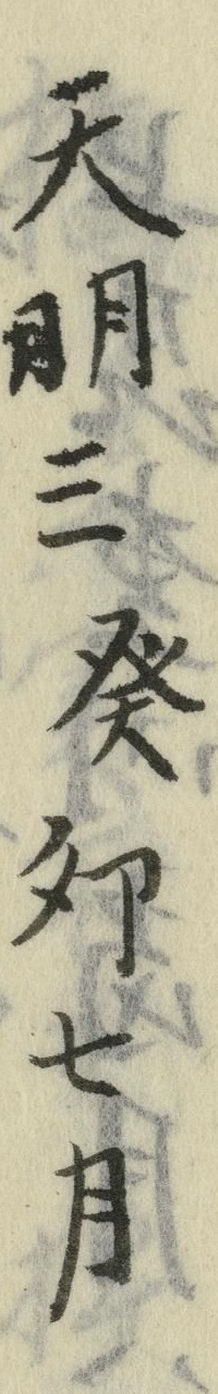天明三癸卯七月
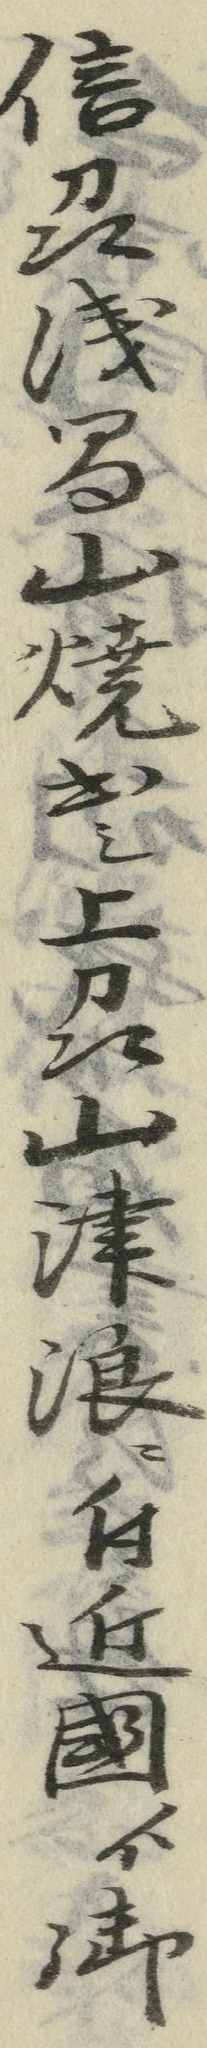信州浅間山焼出シ上州山津浪ニ付近国ゟ御
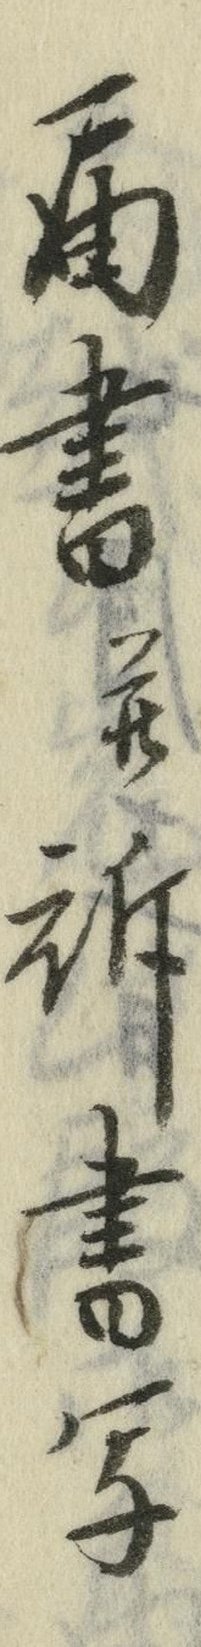届書并訴書写
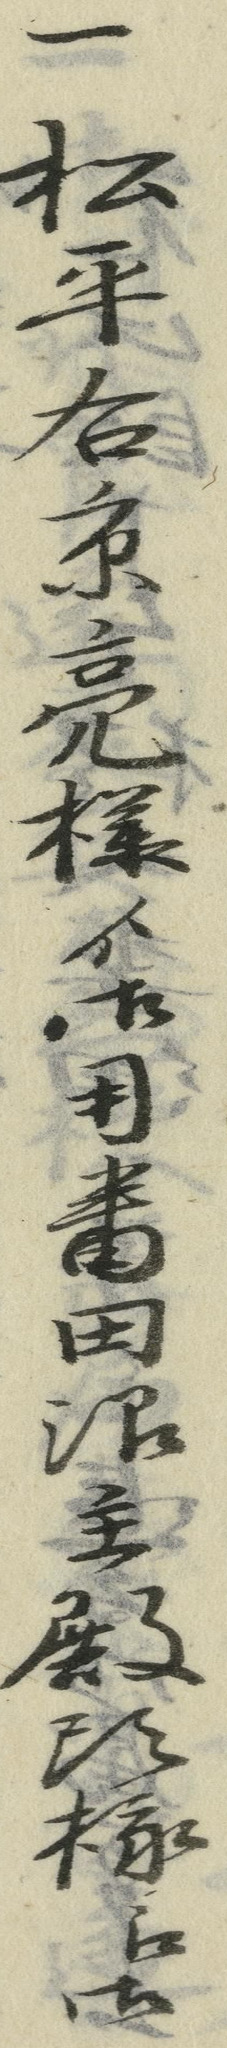一松平右京亮様ゟ御用番田沼主殿頭様江御
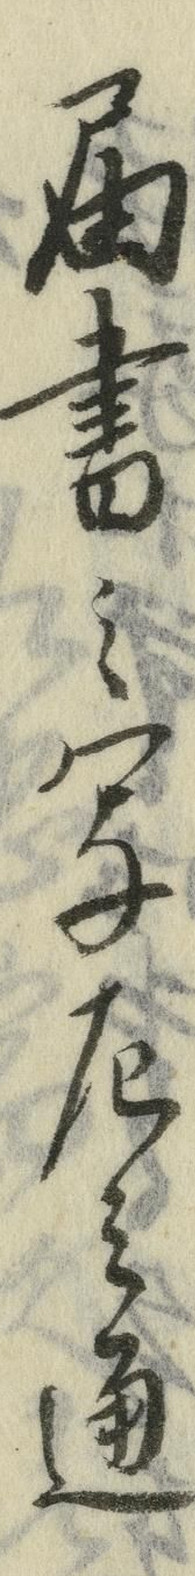届書之写左之通
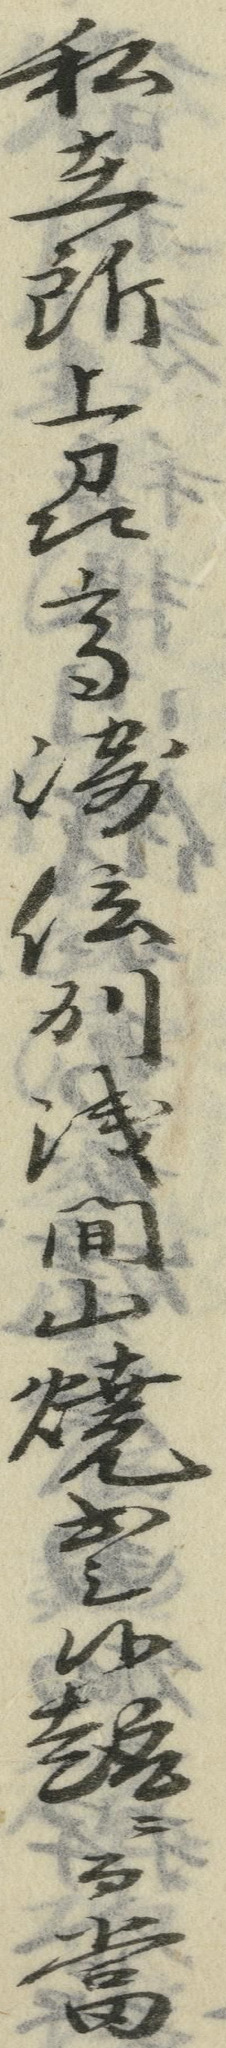私在所上州高崎信州浅間山焼出シ候趣ニ而当
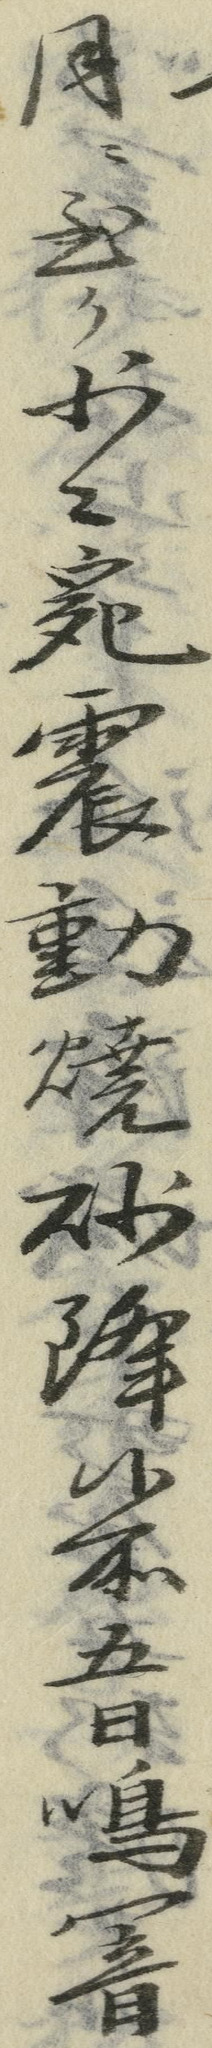月二至り少〻宛震動焼砂降候所五日鳴響
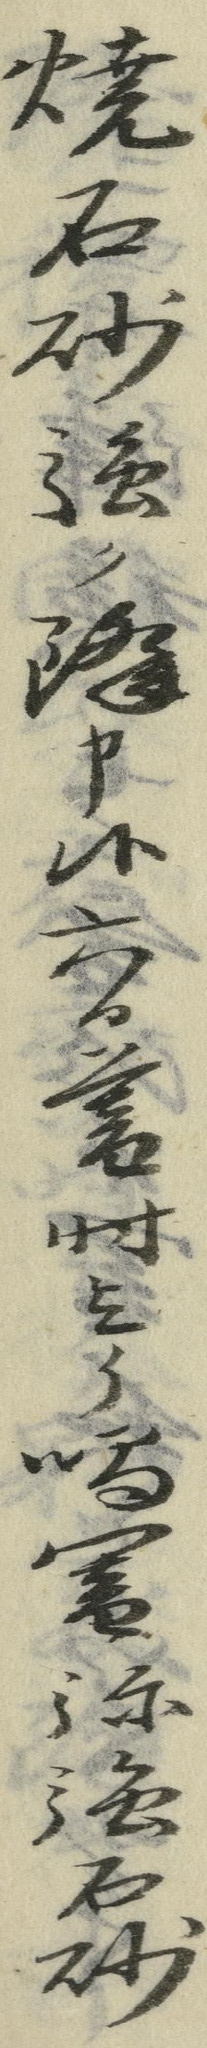焼石砂強ク降申候六日暮時より鳴響弥強石砂

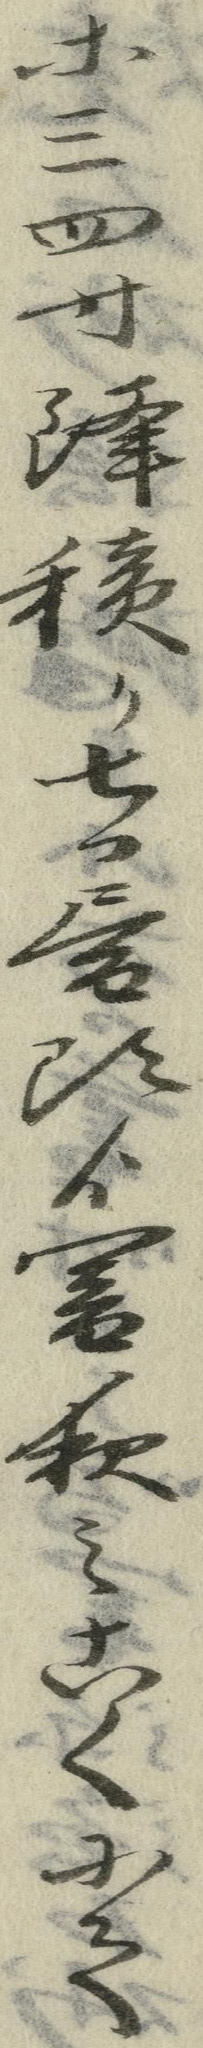等三四寸降積り七日昼頃ゟ闇夜之こくにて
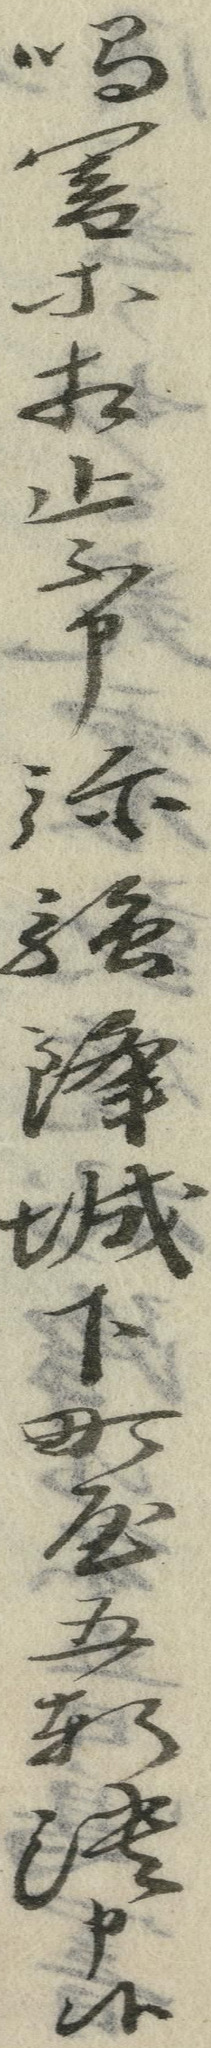鳴響等相止不申弥強降城下町屋五軒潰申候
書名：天明三癸卯七月信州浅間山焼出シ上州山津浪ニ付近國ヨリ御届書并訴書写
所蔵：東京大学地震研究所図書室 Earthquake Research Institute Library, The University of Tokyo, JAPAN
